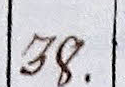38.
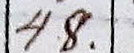48.
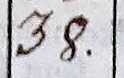38.
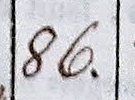86.
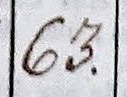63.
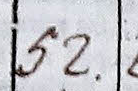52.
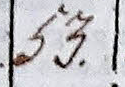53.
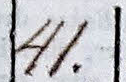41.
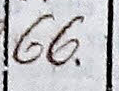66.
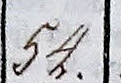54.
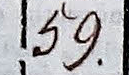59
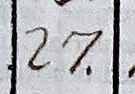27.
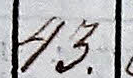43.
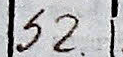52.
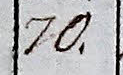70.
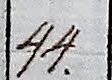44.
